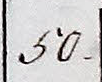50
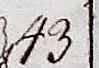43
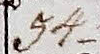54
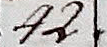42
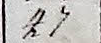47
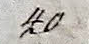40
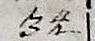34
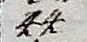44
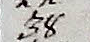38
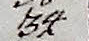34
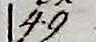49
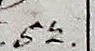52
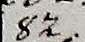82
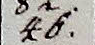46
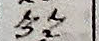32
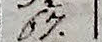67.
